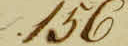156
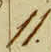11.
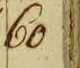60
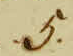5.
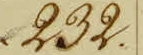232.
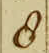8
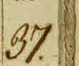37.
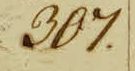307.
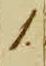1.
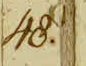48.
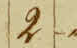2
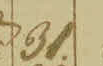31.
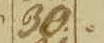30.
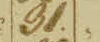31.
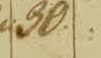30.
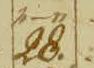28.
